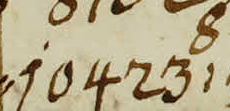10423
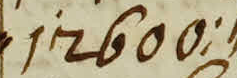12600.
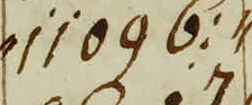11096:
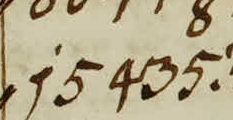15435
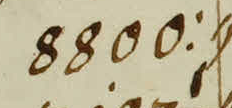8800:
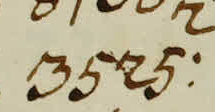3525
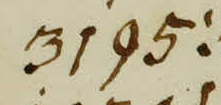3195
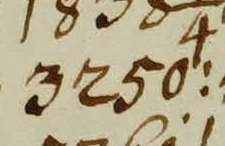3250
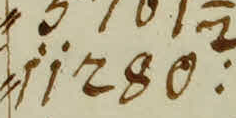11280
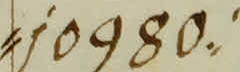10980
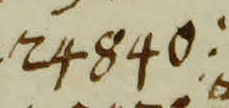24840
